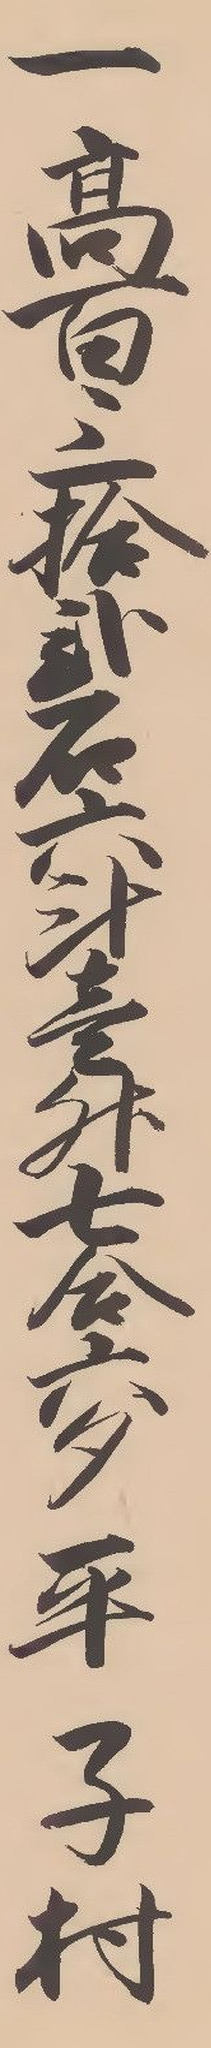一高百三拾弐石六斗壱升七合六勺平子村
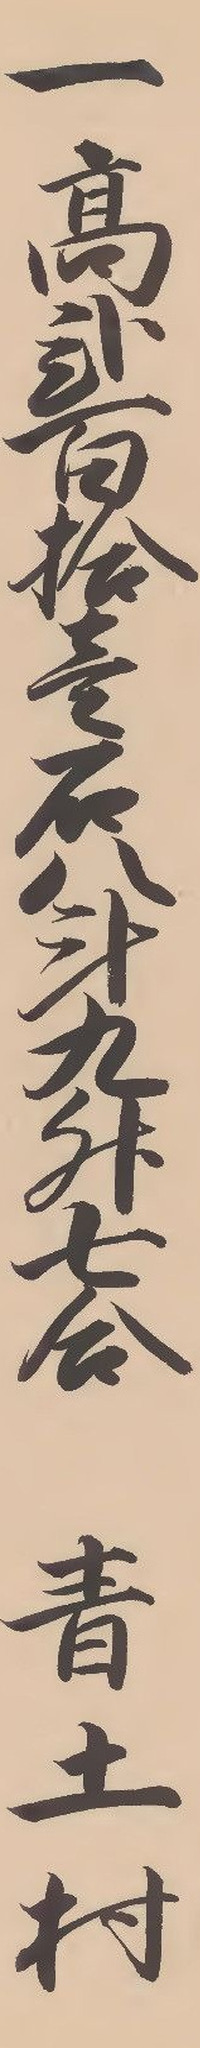一高弐百拾壱石八斗九升七合青土村
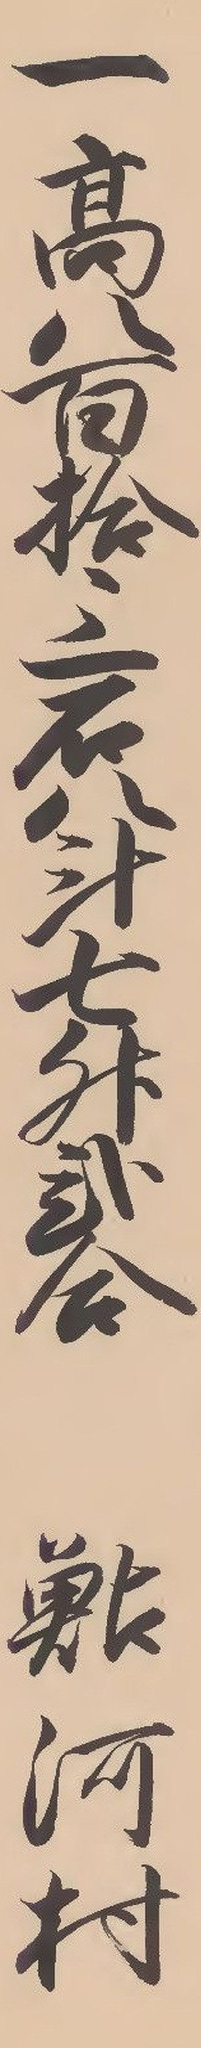一高八百拾三石八斗七升弐合鮎河村

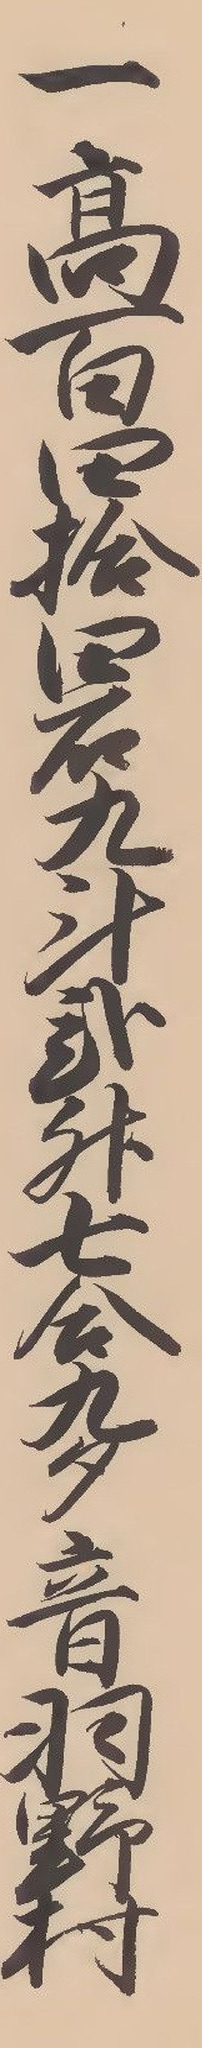一高百四拾四石九斗弐升七合九勺音羽野村
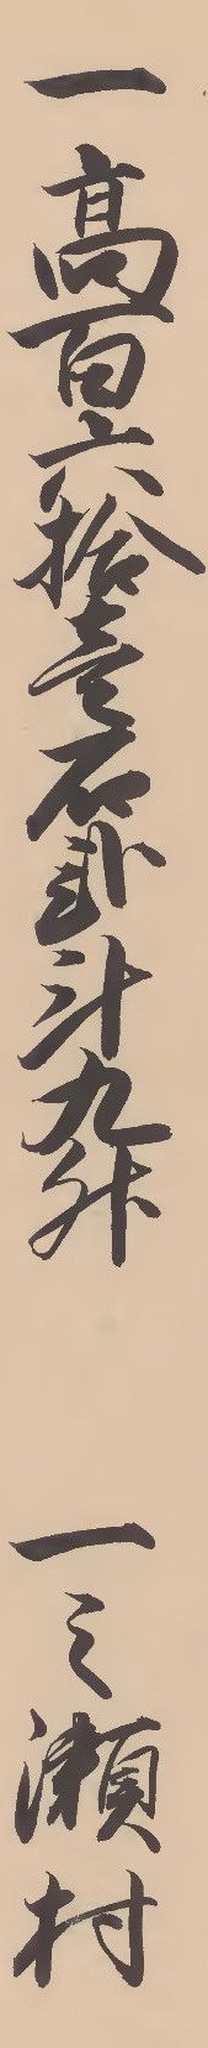一高百六拾壱石弐斗九升一之瀬村
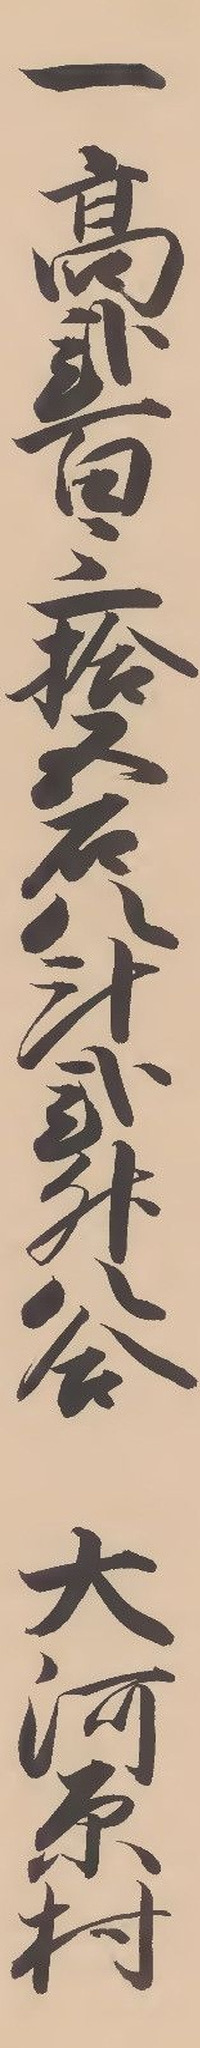一高弐百三拾五石八斗弐升八合大河原村
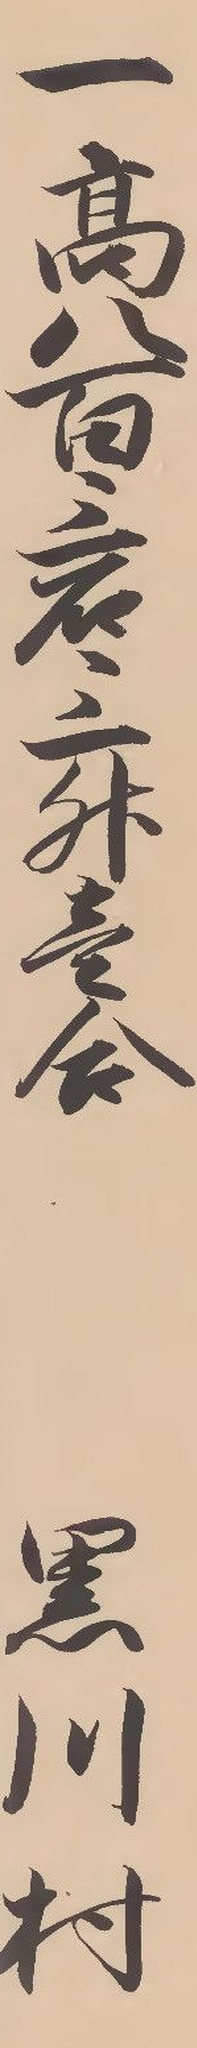一高八百三石三升壱合黒川村
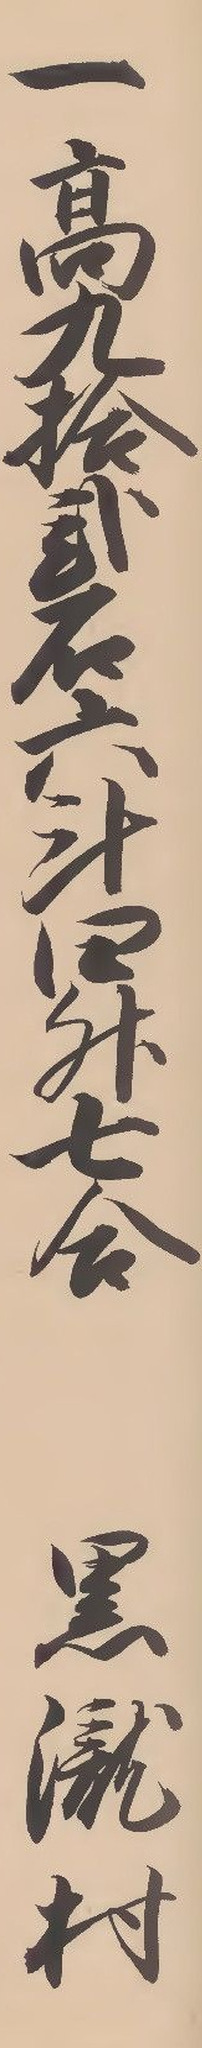一高九拾弐石六斗四升七合黒滝村
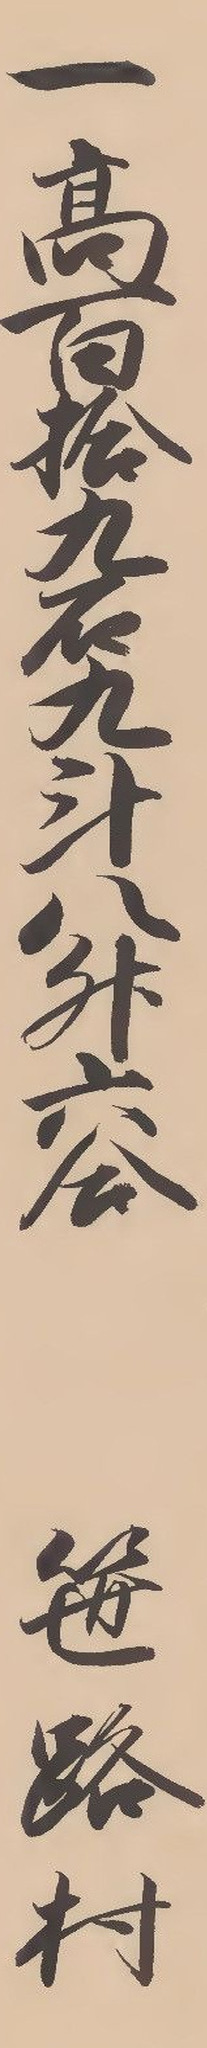一高百拾九石九斗八升六合笹路村
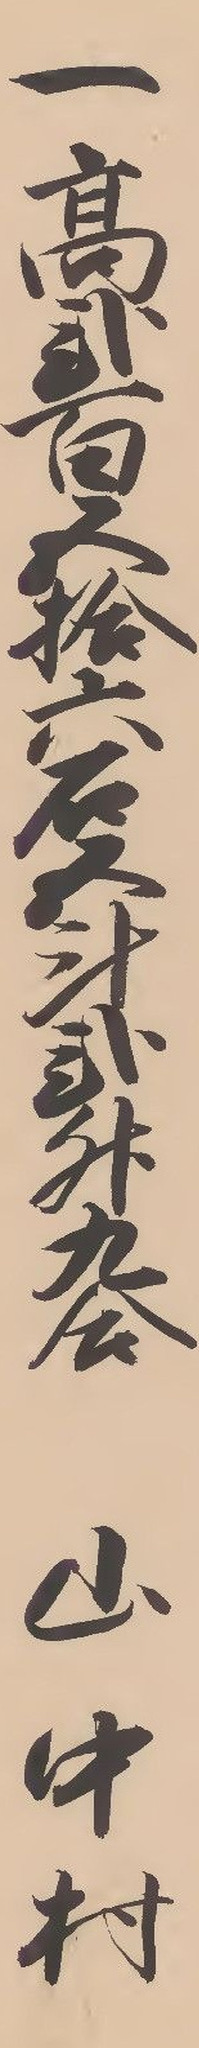一高弐百五拾六石五斗弐升九合山中村

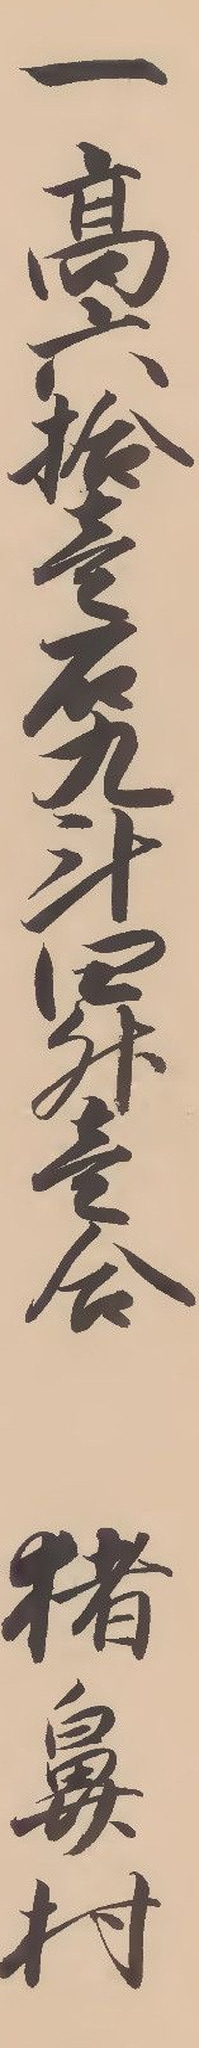一高六拾壱石九斗四升壱合猪鼻村
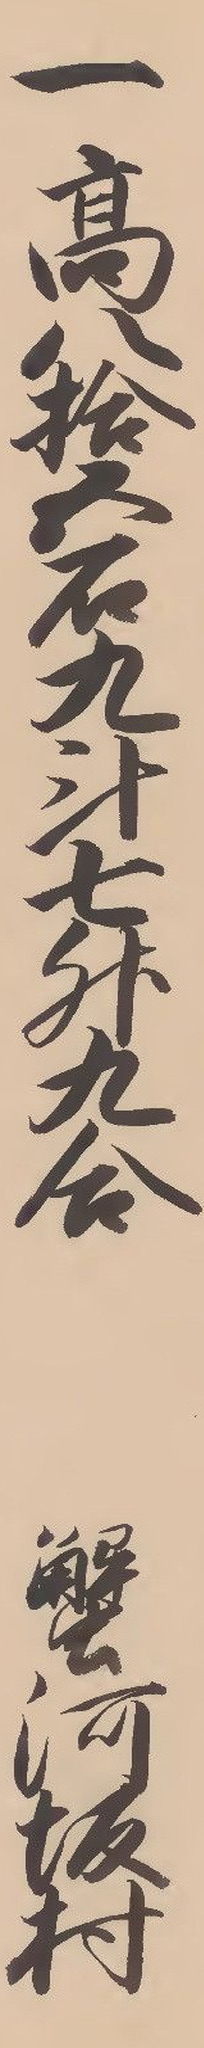一高八拾五石九斗七升九合蟹河坂村
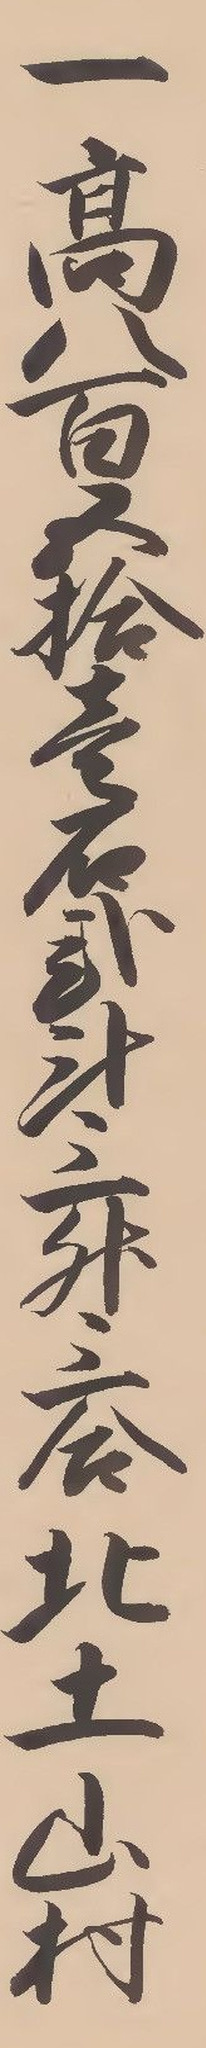一高八百五拾壱石弐斗三升三合北土山村
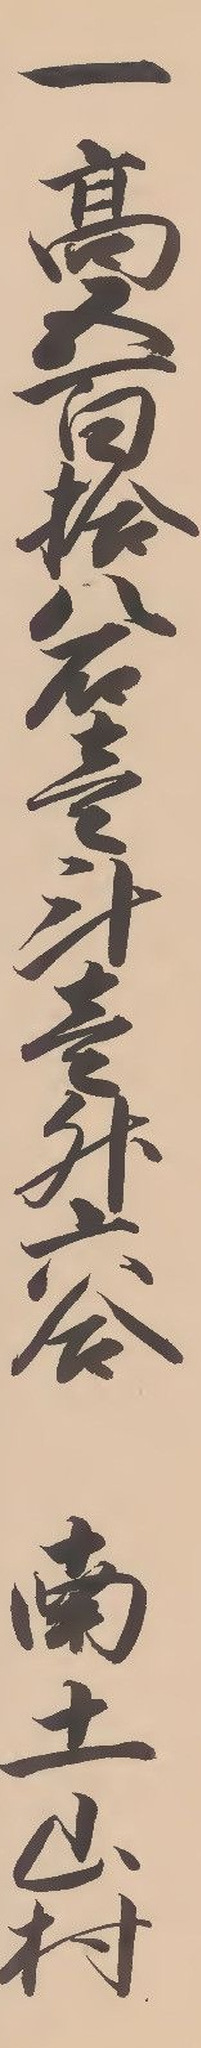一高五百拾八石壱斗壱升六合南土山村
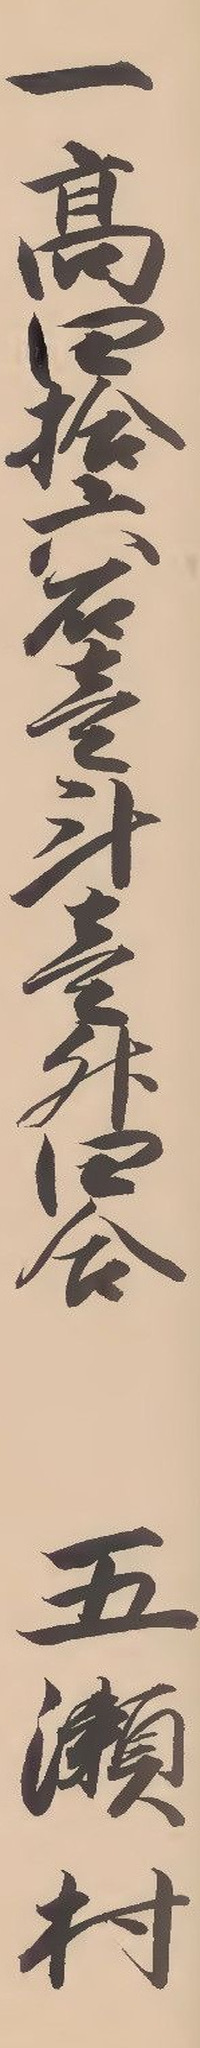一高四拾六石壱斗壱升四合五瀬村
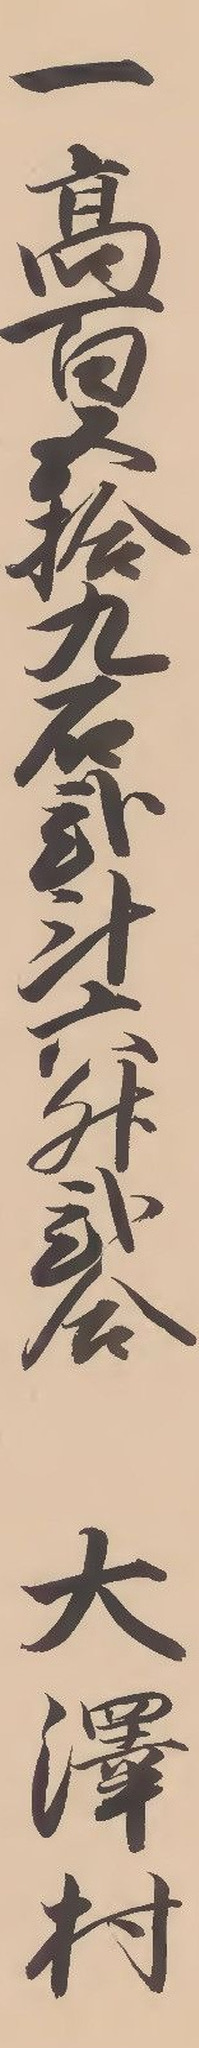一高百五拾九石弐斗六升弐合大沢村
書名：近江国郷帳
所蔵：国立公文書館 National Archives of Japan
